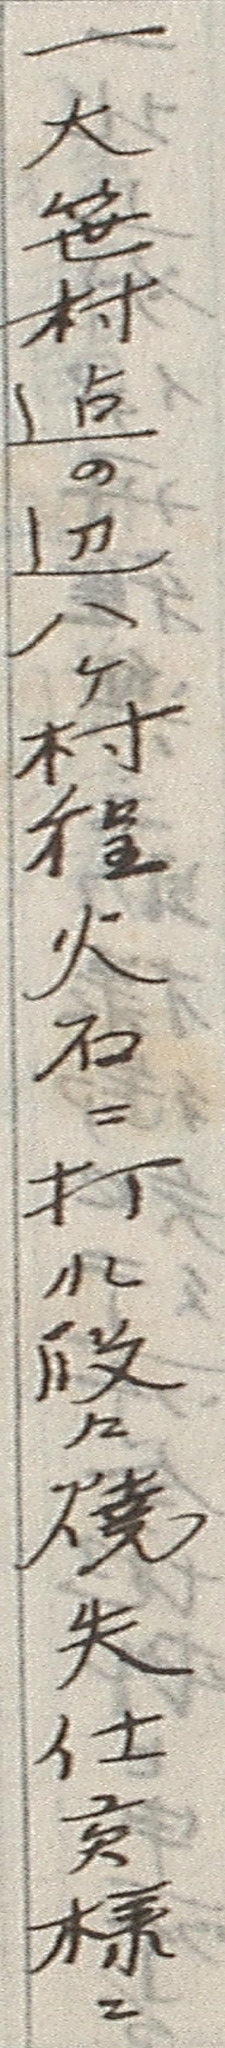一大笹迄の辺八ヶ村程火石二打れ段々焼失仕候様二
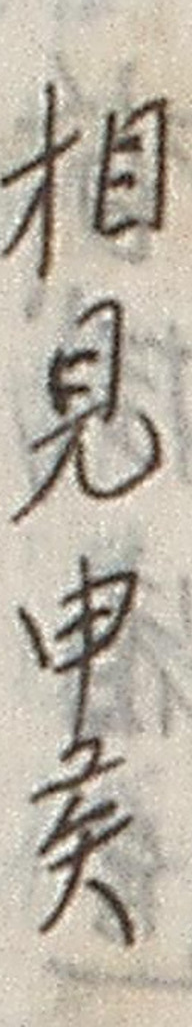相見申候
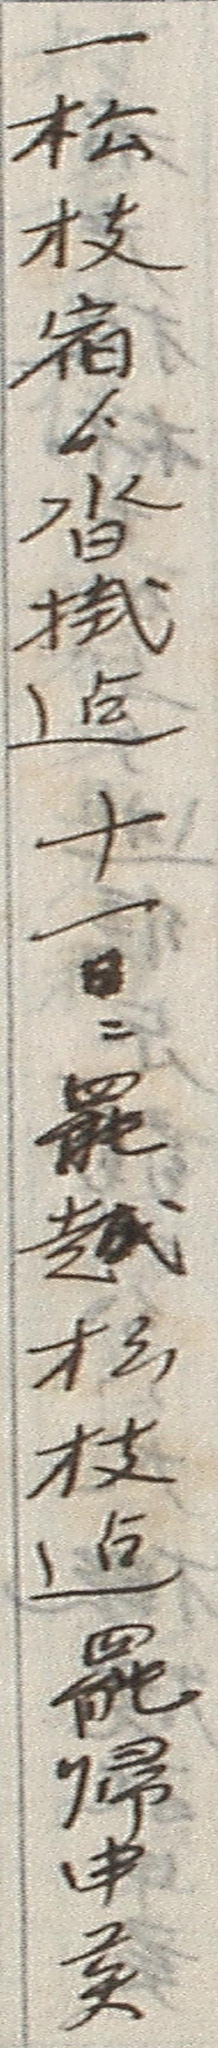一松枝宿ゟ沓掛迄十一日二罷越松枝迄罷帰申候
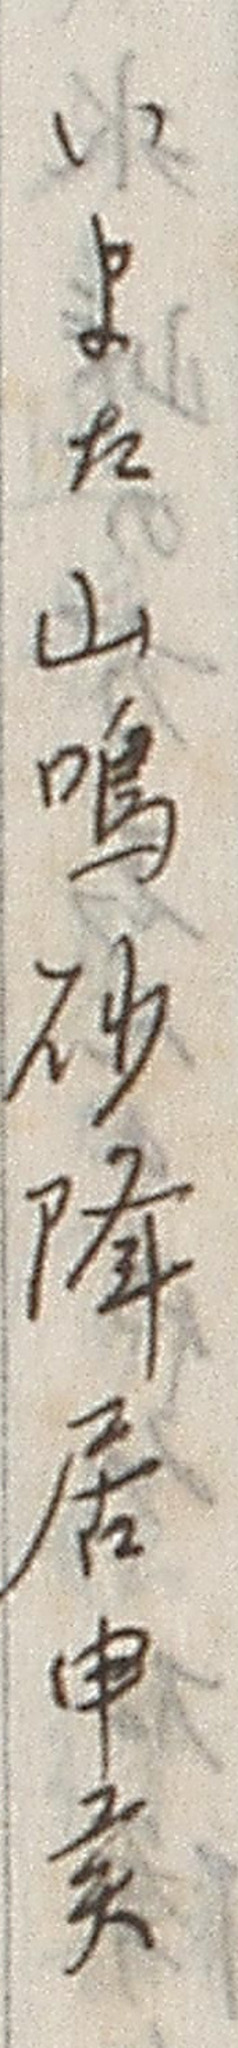いまた山鳴砂降居申候
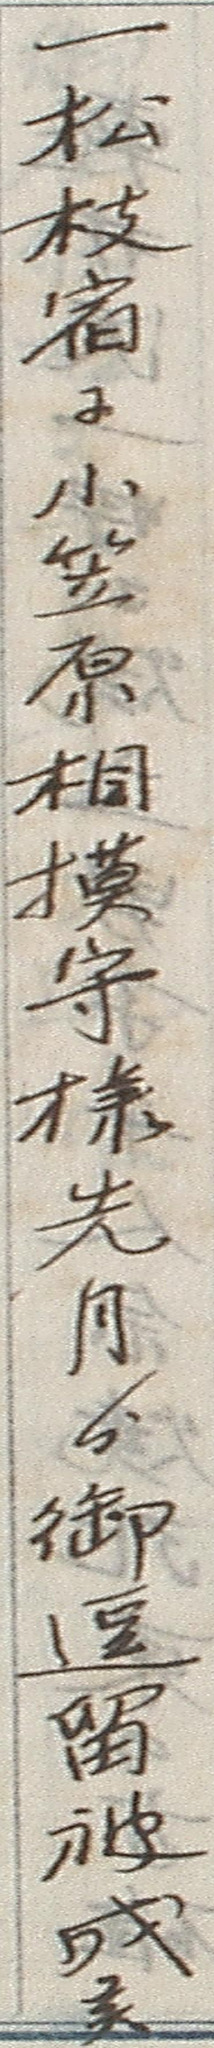一松枝宿二小笠原相模守様先月ゟ御逗留被成候
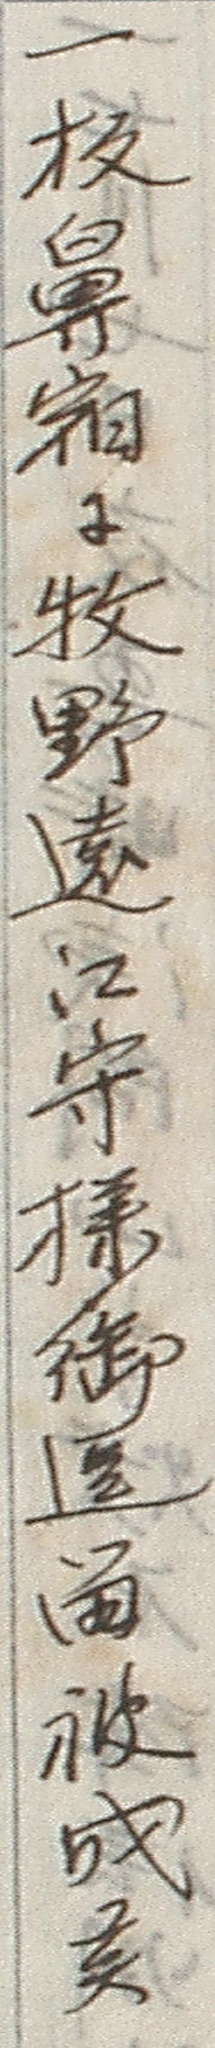一板鼻宿に牧野遠江守様御逗留被成候

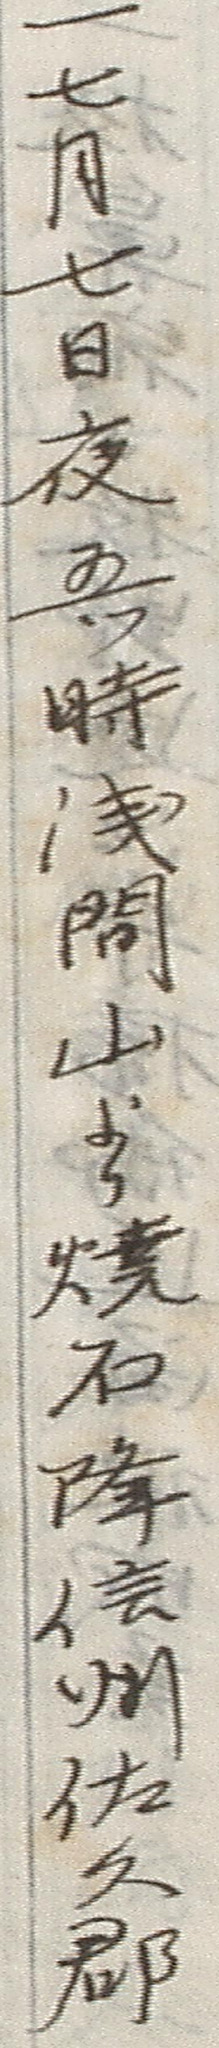一七月七日夜五ツ時浅間山より焼石降信州佐久郡
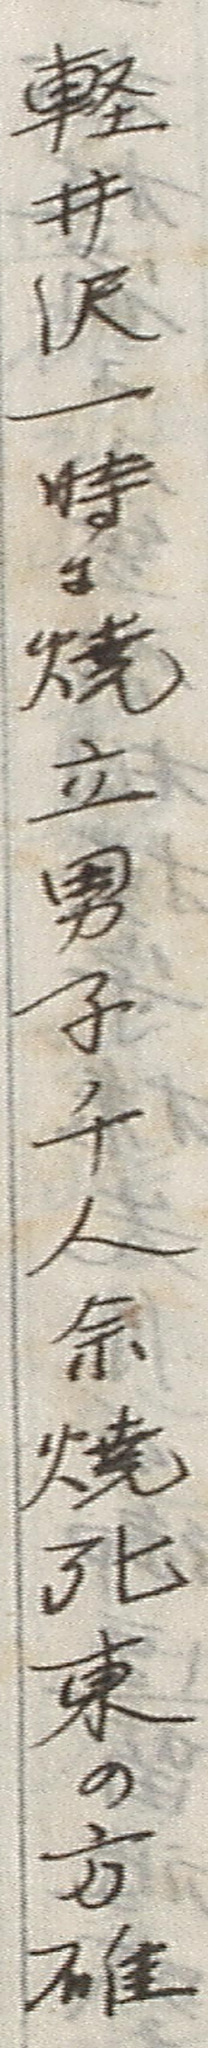軽井沢一時に焼立男子千人余焼死東の方碓
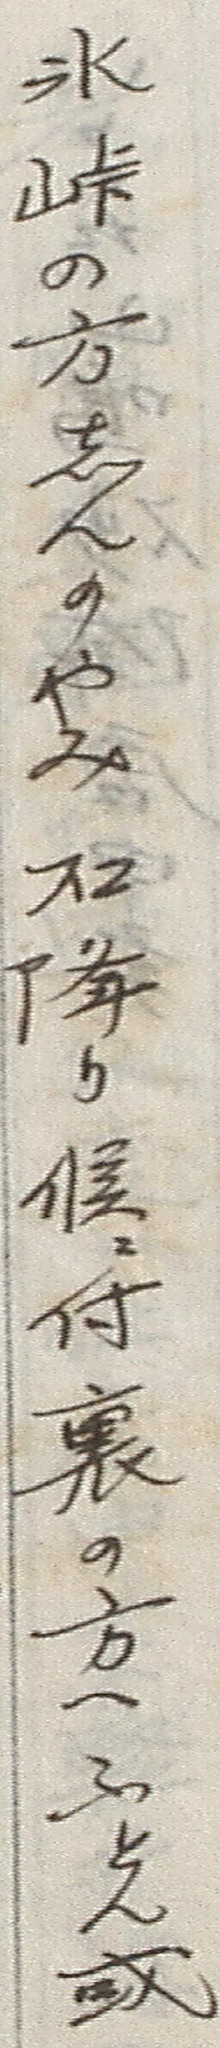氷峠の方しんのやみ石降り候に付裏の方へふとん或
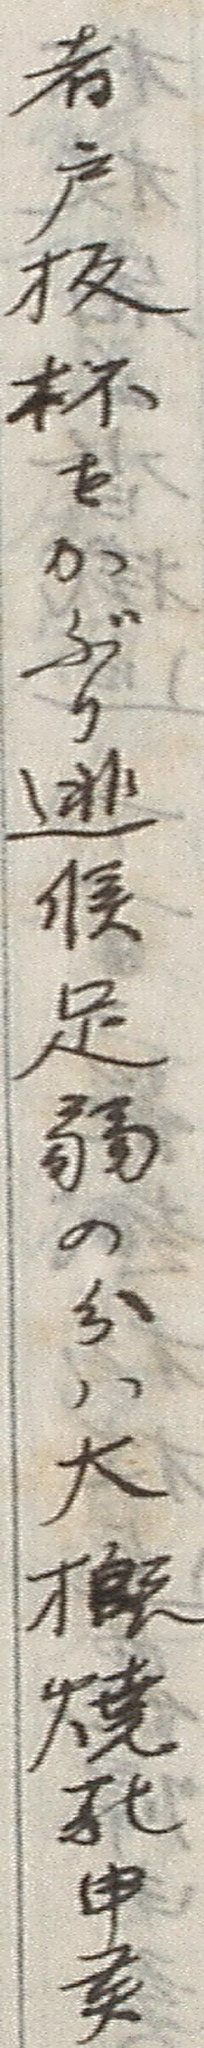者戸板杯をかぶり逃候足弱の分ハ大概焼死申候
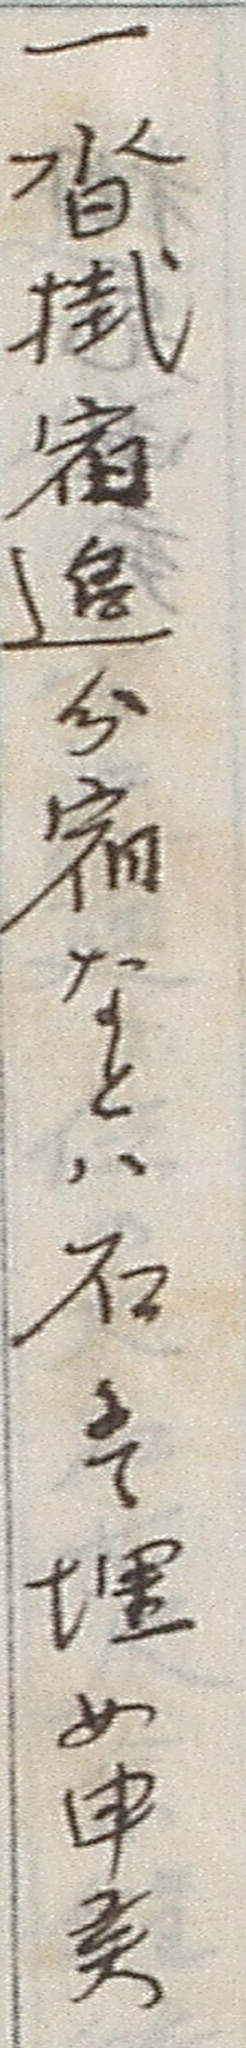一沓掛宿追分宿なとは石にて埋め申候
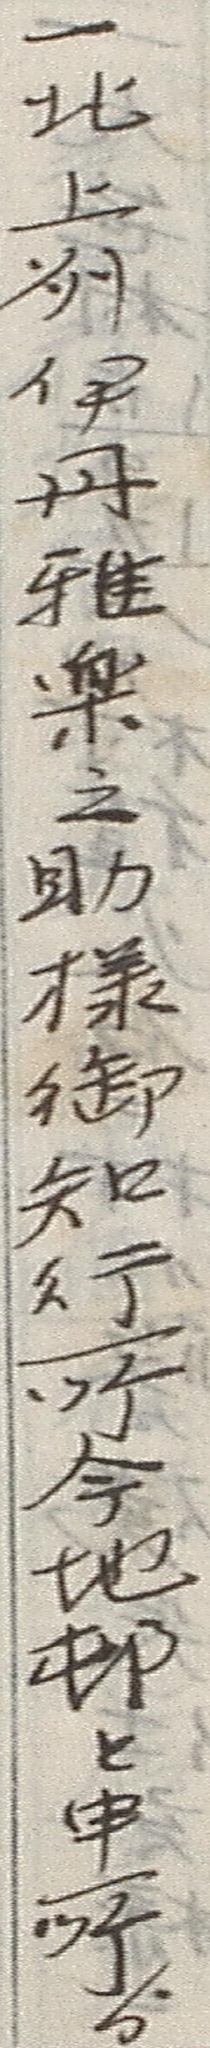一北上州伊丹雅楽之助様御知行所今地邨と申所ゟ
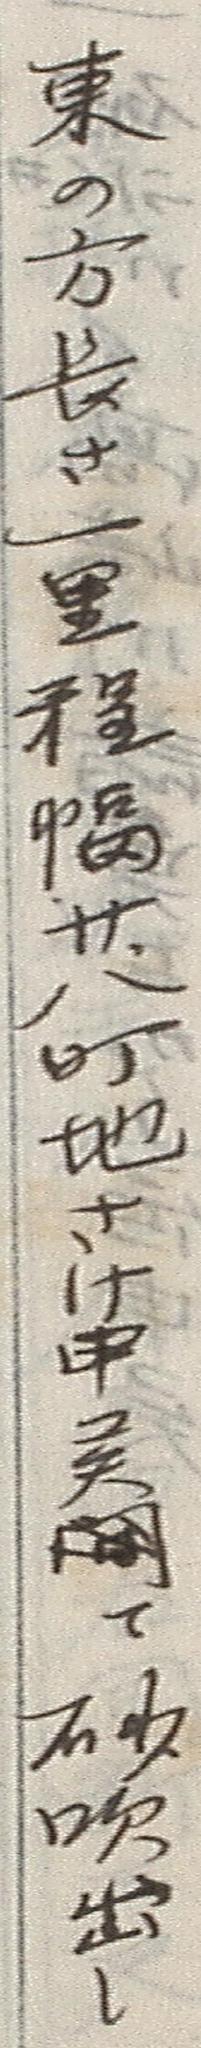東の方長さ一里程幅廿八町地さけ申候間て砂吹出し
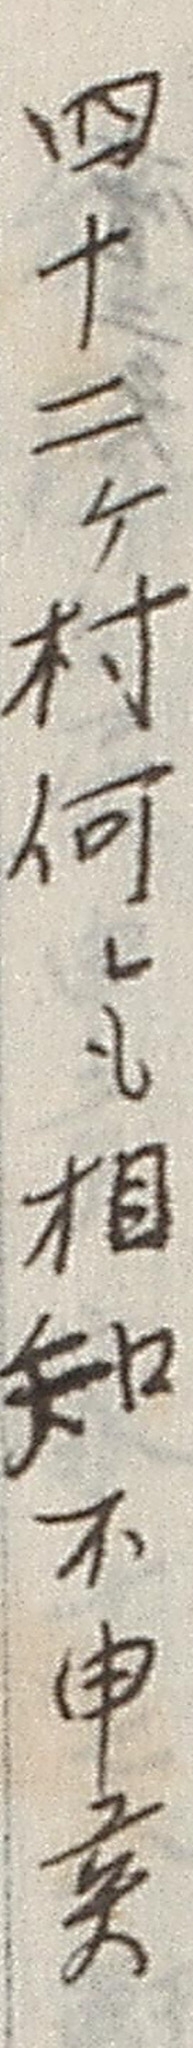四十二ヶ村何レも相知不申候
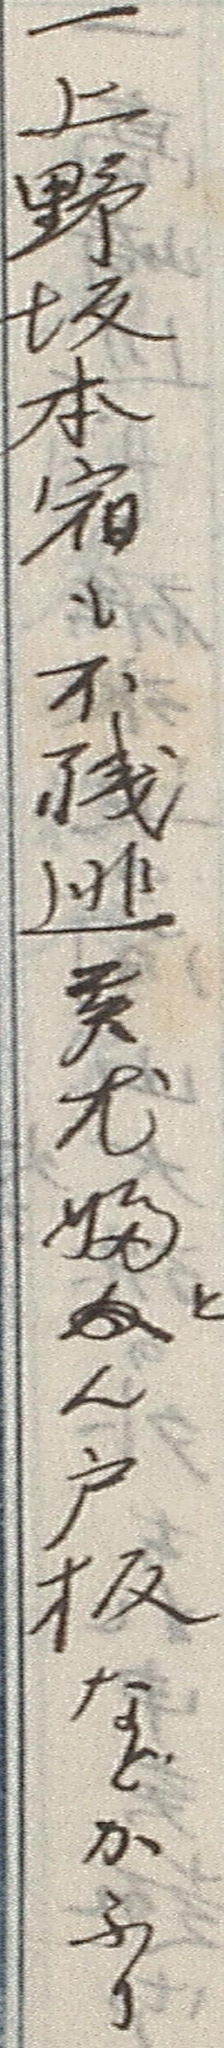一上野坂本宿も不残逃候尤ふとん戸板などかふり
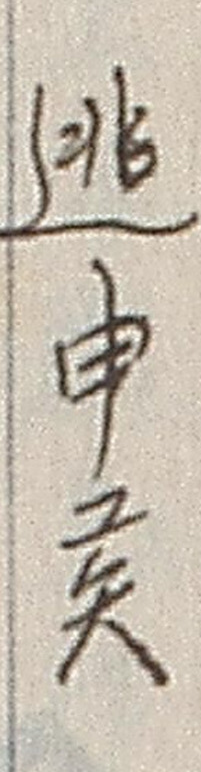逃申候
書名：浅間山焼出記
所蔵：東京大学地震研究所図書室 Earthquake Research Institute Library, The University of Tokyo, JAPAN
